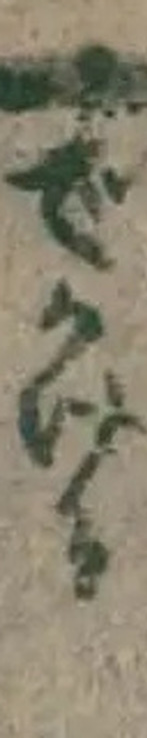でかける
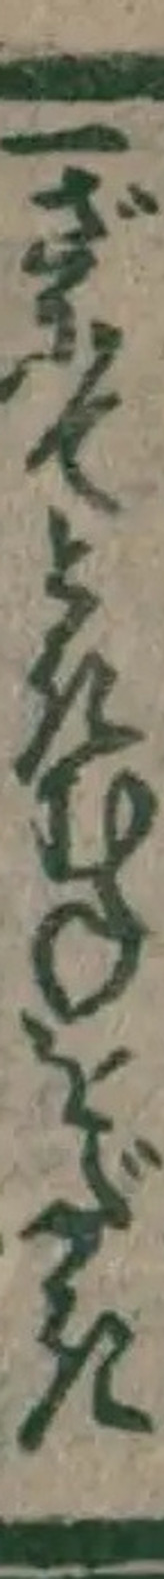一ざにてときむねをだき
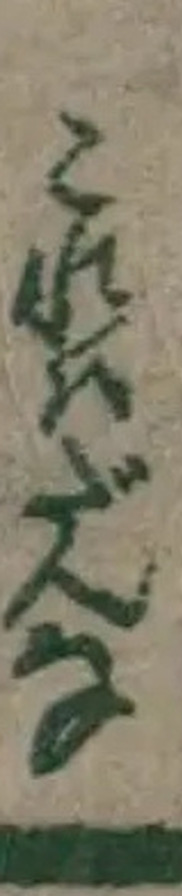これはだんな
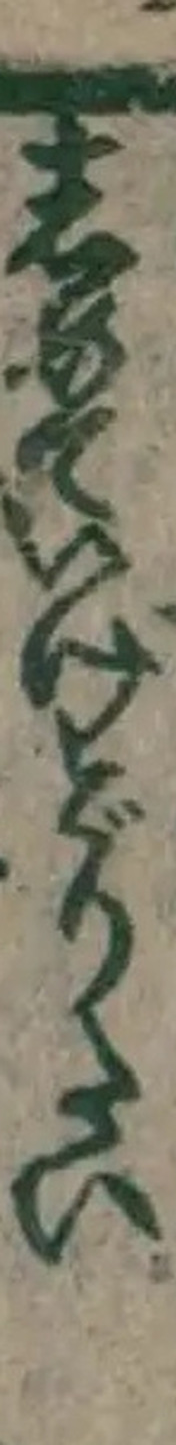しめていけどりたい
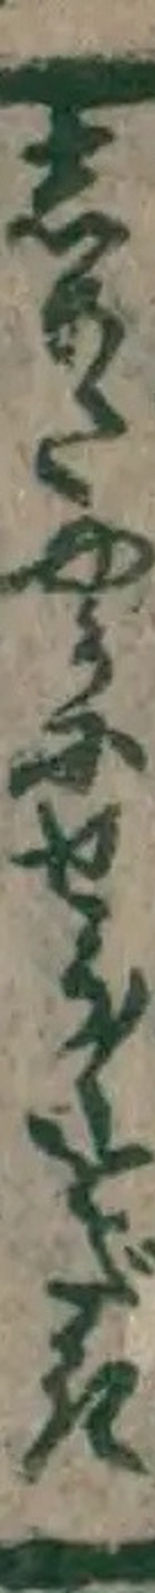しもたやうにせう〳〵をだき
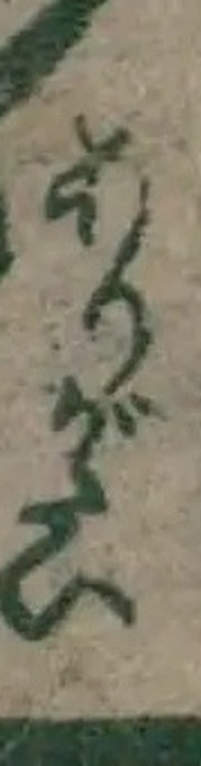ありがたい
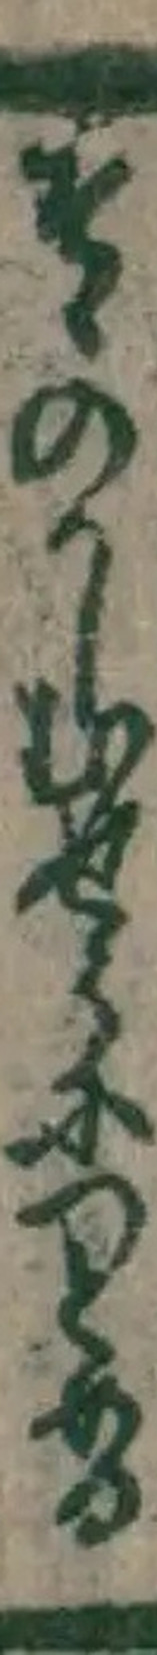そゝのかしむせうにつとめる
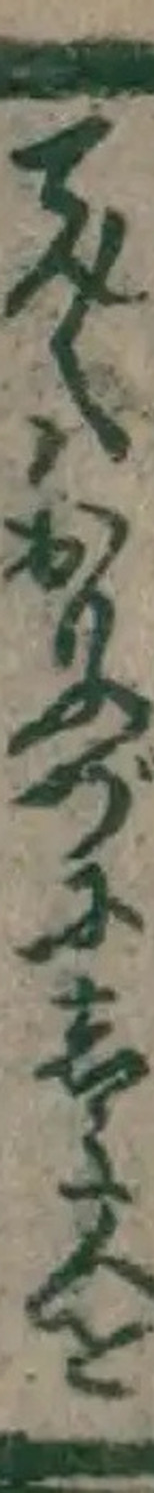てん〳〵はおもふづにしよ人を
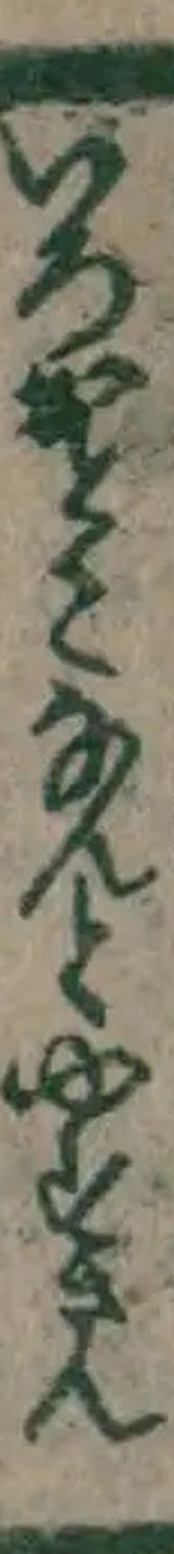いろおとこなんとやすさん
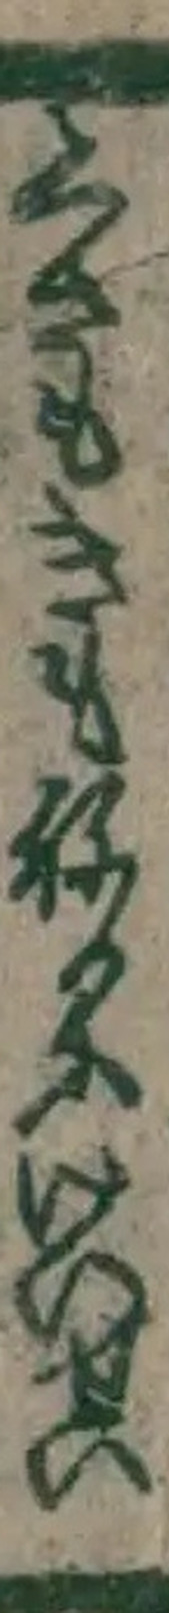くさもきもねかふけいせい
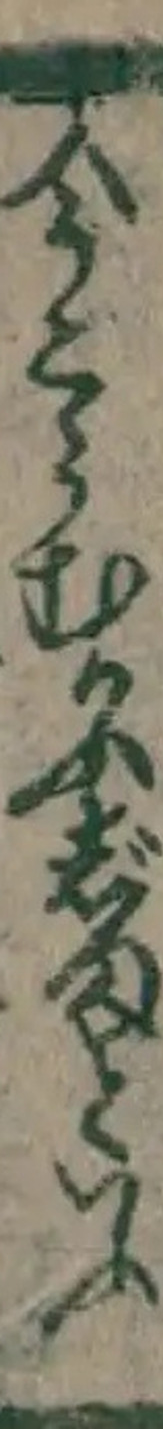今こうむかふじまといふ
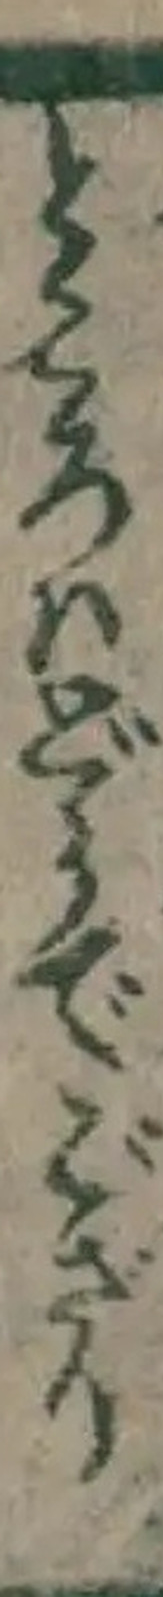ところはどうでござり
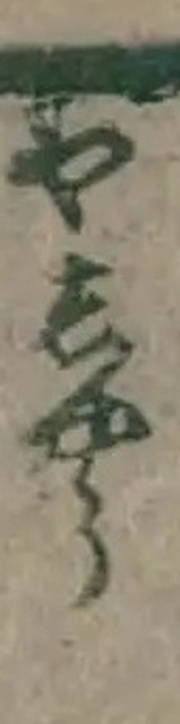やしやう

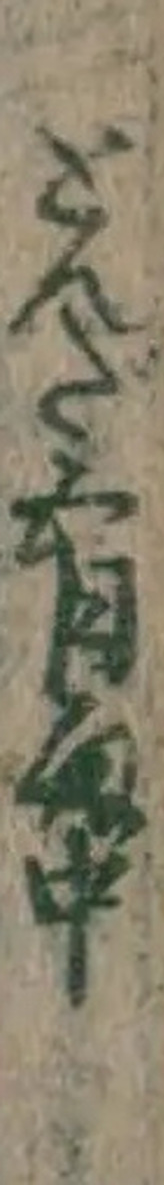とんだ五月雨中
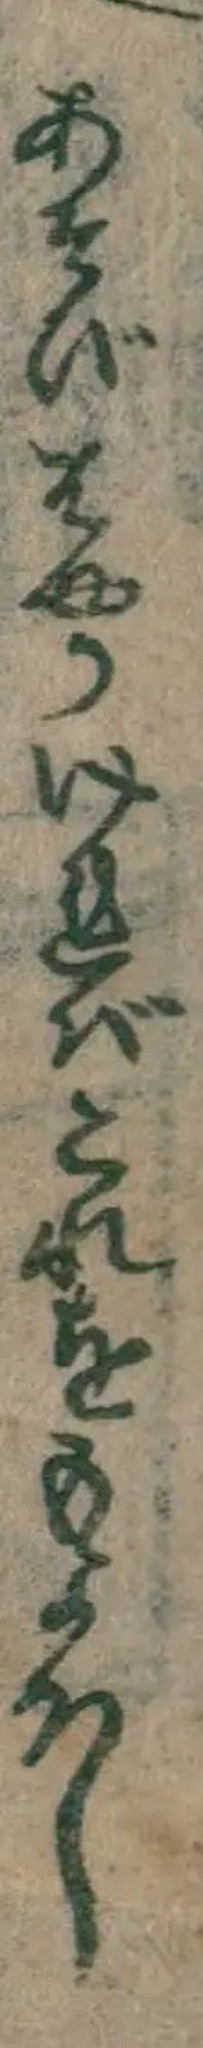あそびはやりければこれをもよほし
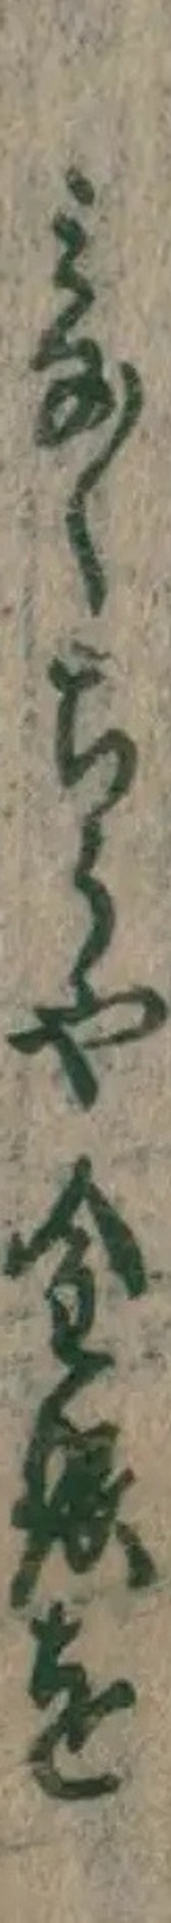みな〳〵ちうや金銀を
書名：頓作時雨月 3巻
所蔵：国立国会図書館 National Diet Library, JAPAN
